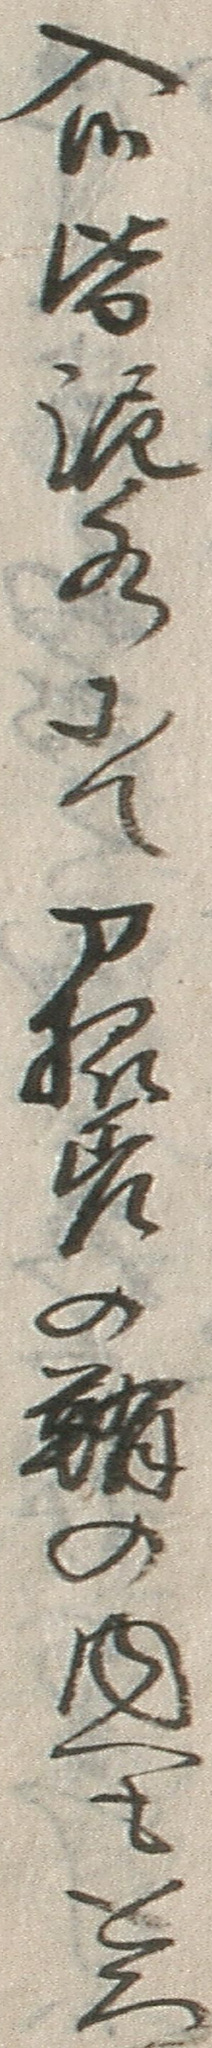入候皆泥水にて刀脇差の鞘の内へもとろ
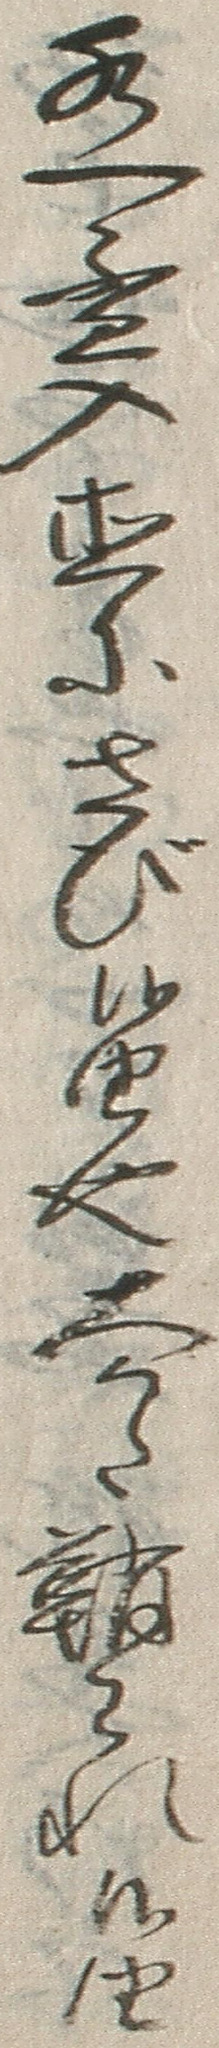水一盃入直にさび候由也大かた鞘われ候由

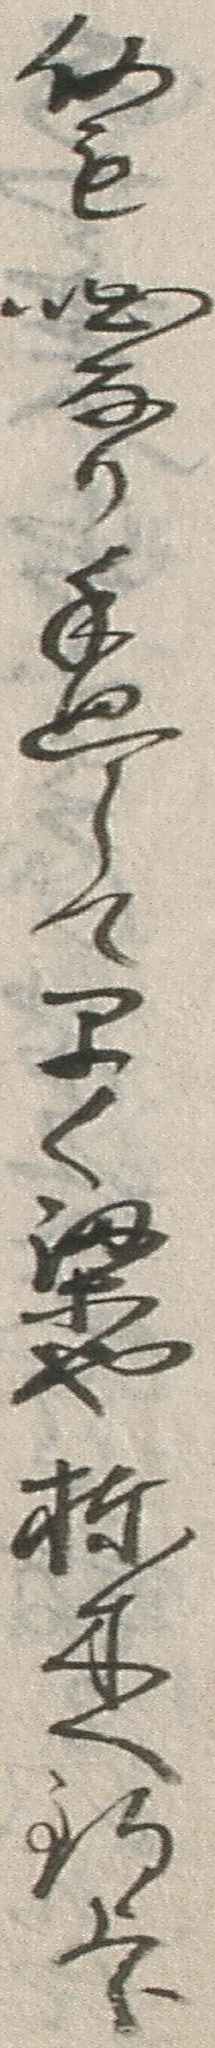何も咄なり手廻して早く梁や棟木へ釣上ら
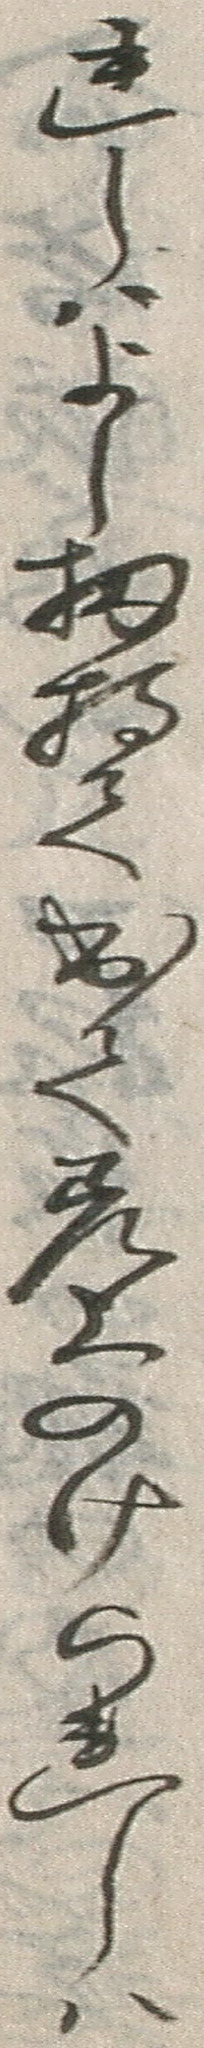れしはよし扨持て出て差上のけられしは
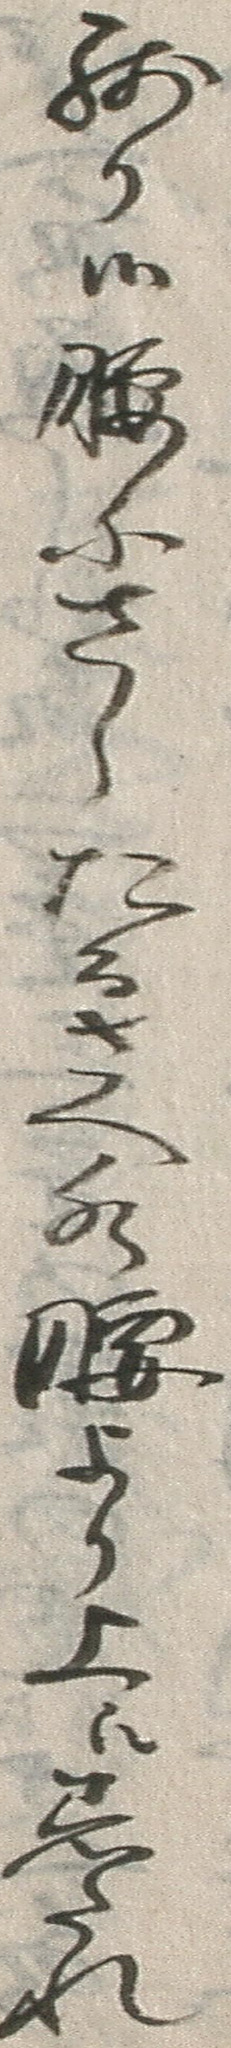残り候腰にさしたるさへ水腰より上え着たれ
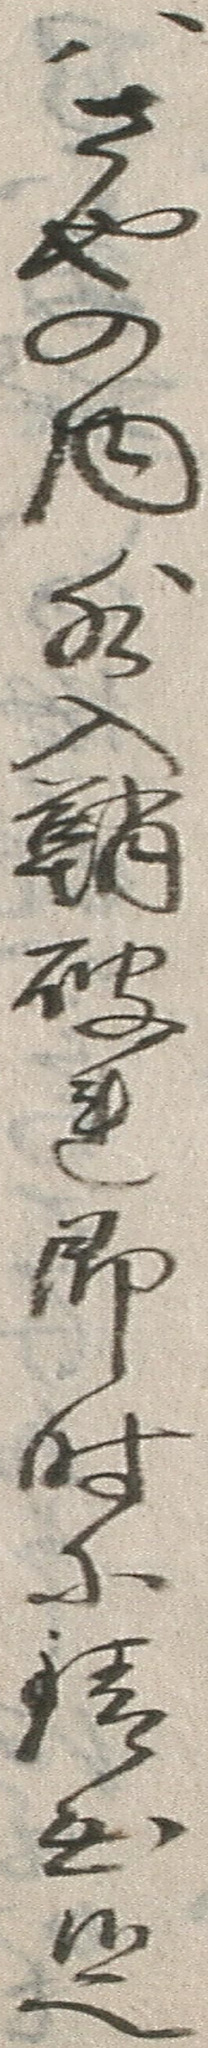はさやの内水入鞘破れ即時に錆出候也
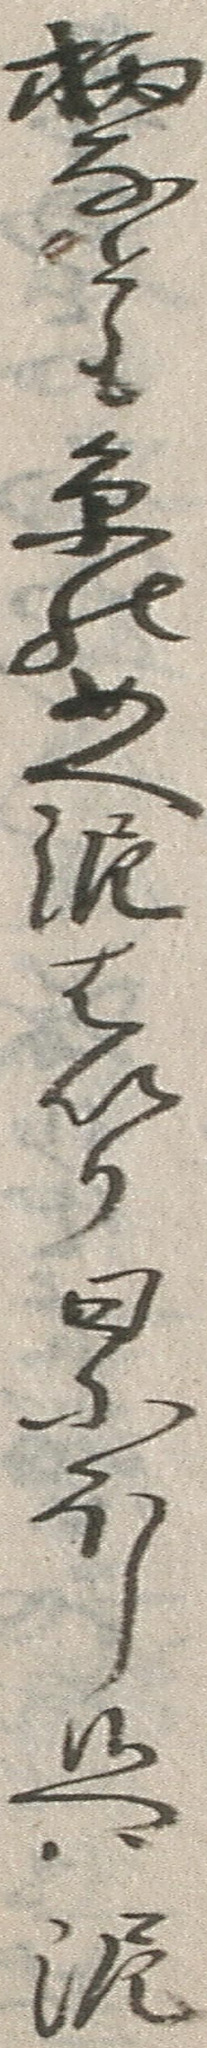柄なとも糸のめへ泥はいり日にほし候へは泥
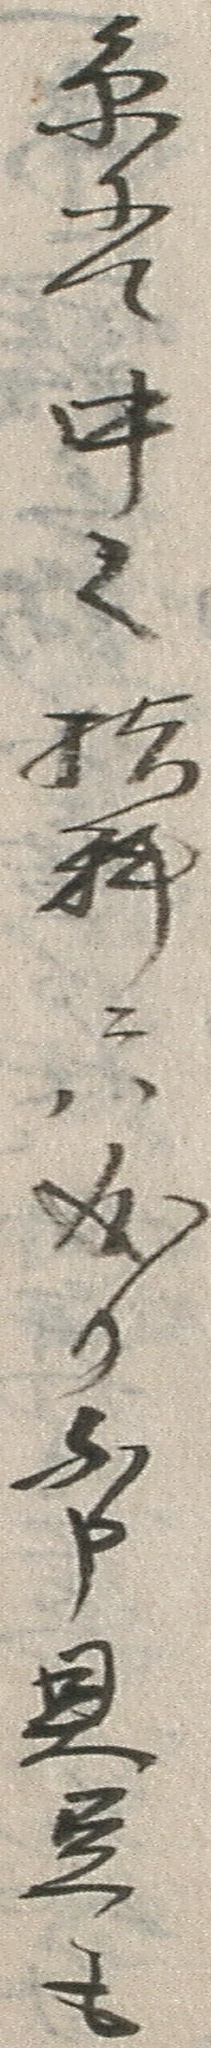糸にて中々指料には成り不申具足も
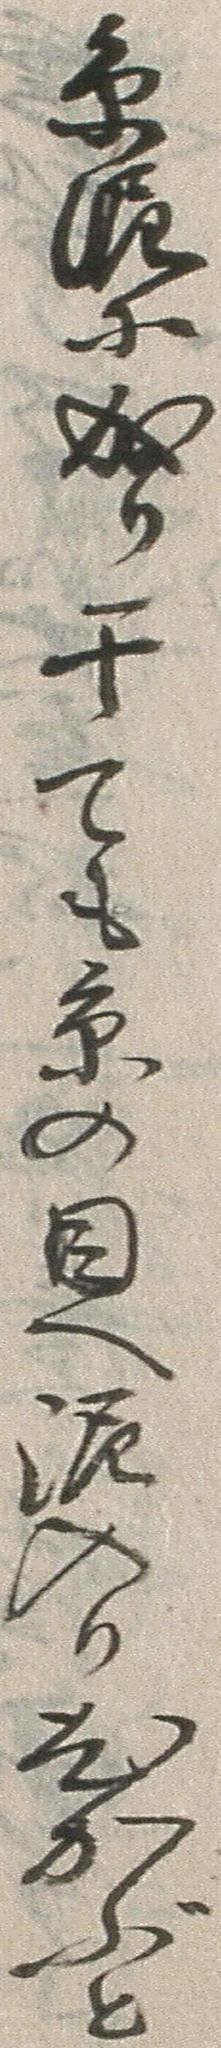糸泥に成り干ても糸の目へ泥入り尤かぶと
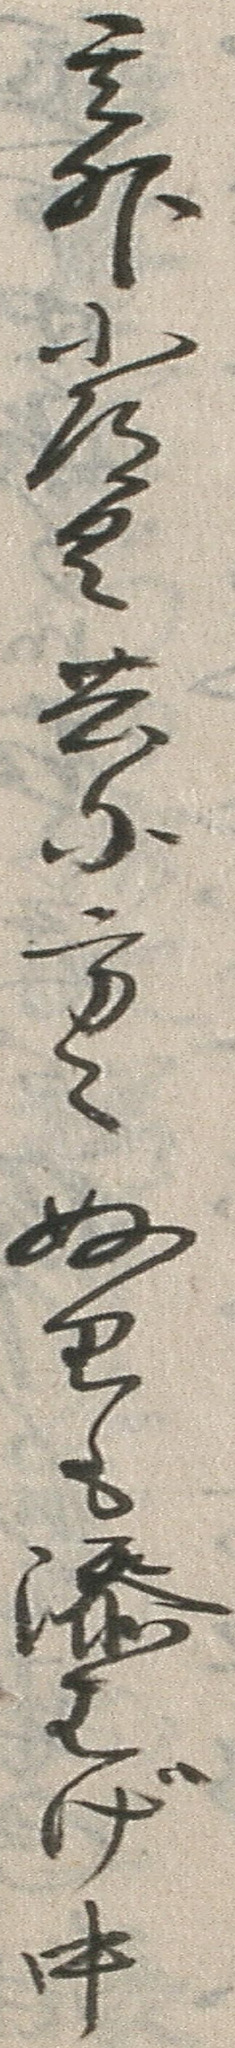其外小道具共に方々ぬりも漆はげ中
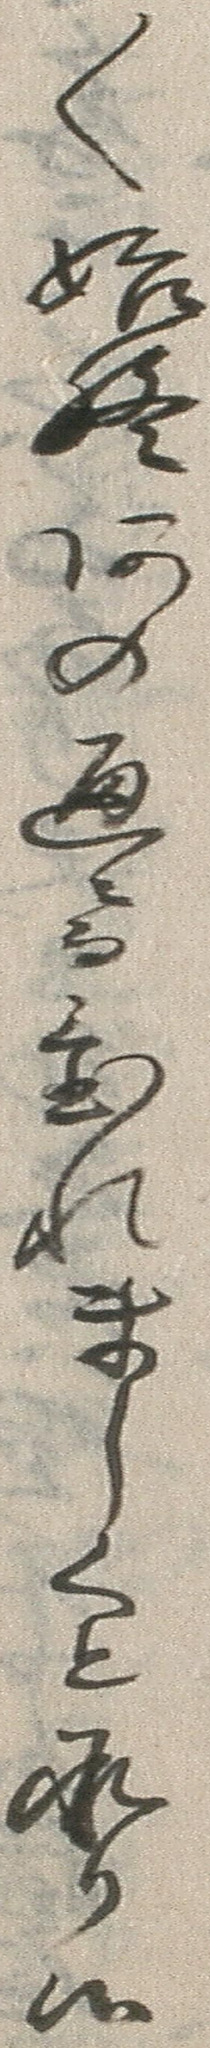〳〵始終あの通にて置れましくと承り候
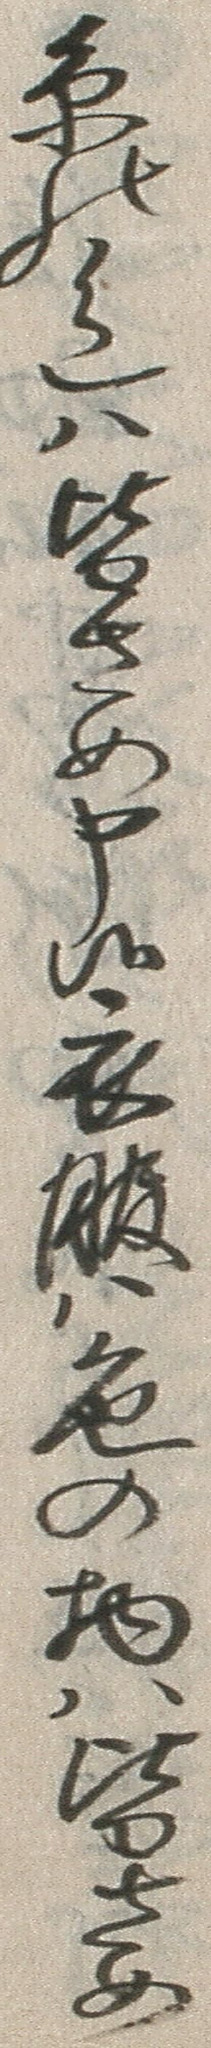糸の色は皆さめ申候衣服は色の物は皆さめ
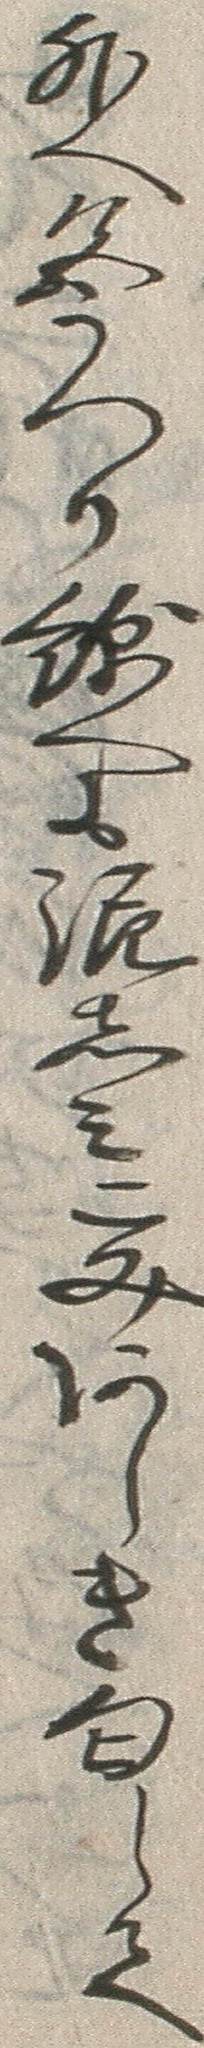外へ色うつり綿へも泥しみこみあしき匂して
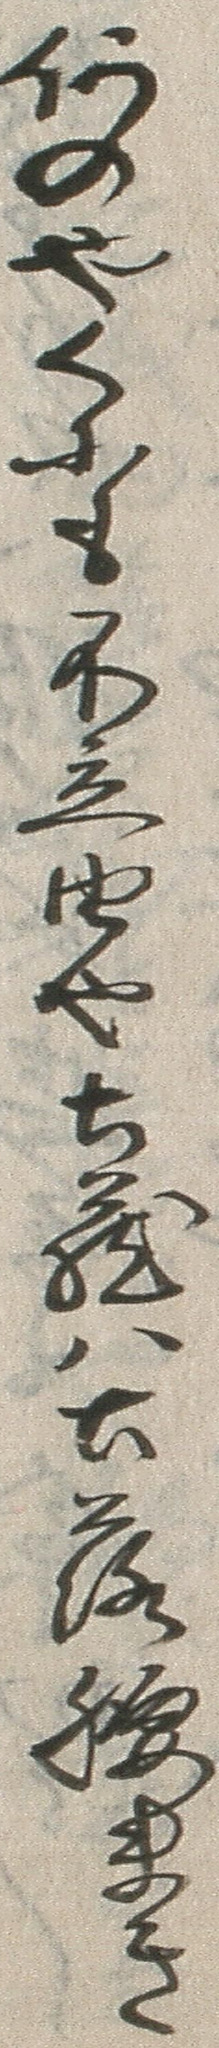何のやくにも不立由也土蔵は土落腰まき
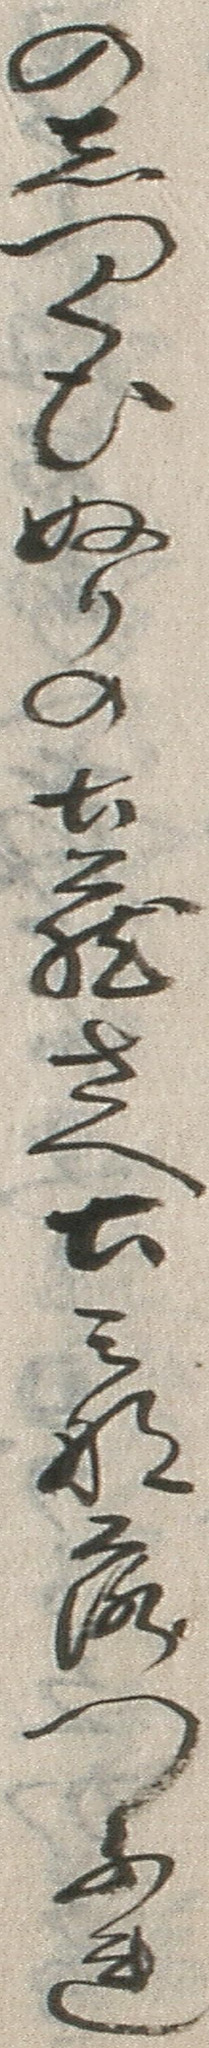のしつくひぬりの土蔵さへ土みな落つふれ
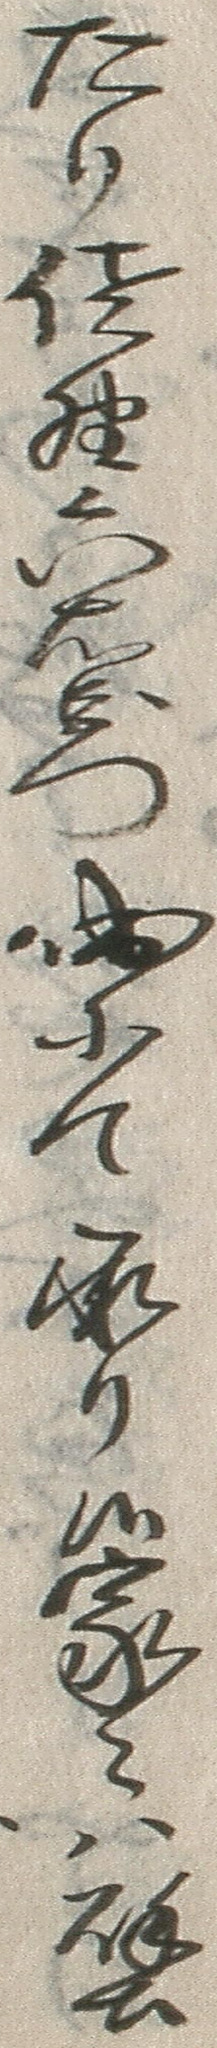たり佐野六右衛門咄にて承り候家々は壁
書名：享保十三年江戸洪水記
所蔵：東京大学地震研究所図書室 Earthquake Research Institute Library, The University of Tokyo, JAPAN
